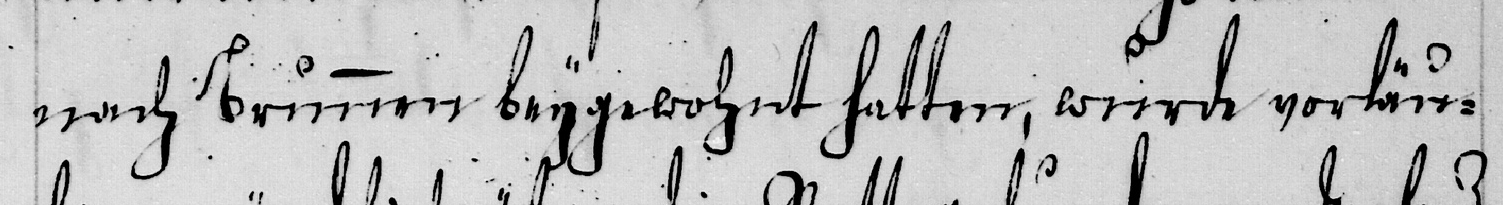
nach Brunnen beygewohnt hatten, wurde vorläu¬
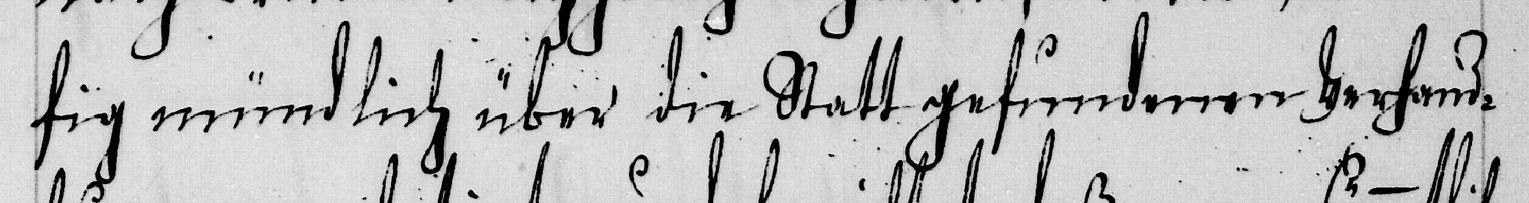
fig mündlich über die Statt gefundenen Verhand¬
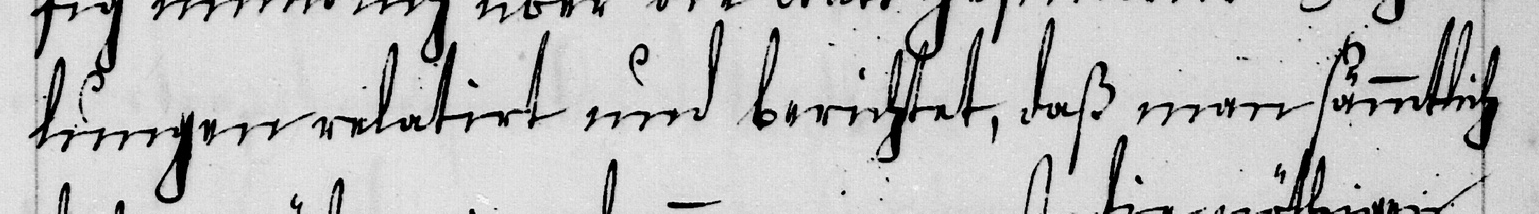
lungen relatirt und berichtet, daß man sämmtlich
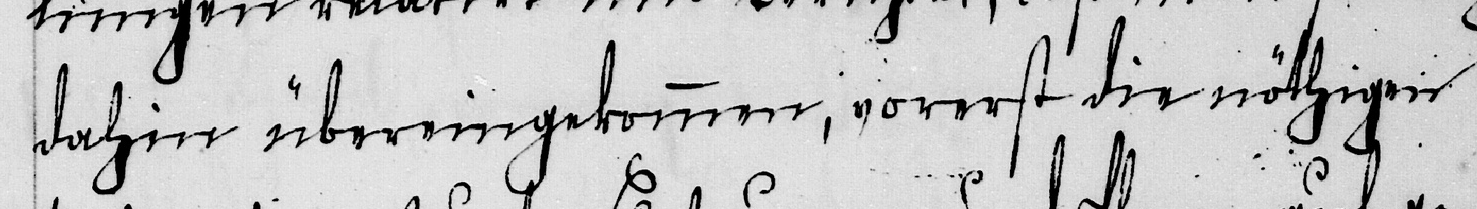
dahin übereingekommen, vorerst die nöthigen
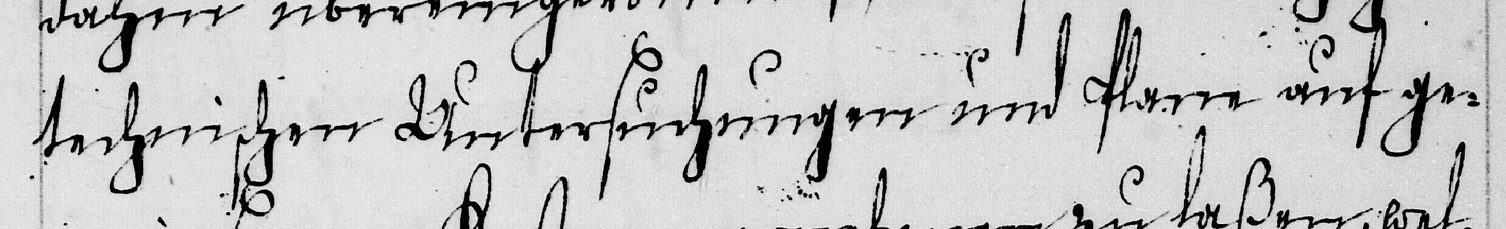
technischen Untersuchungen und Plane auf ge¬
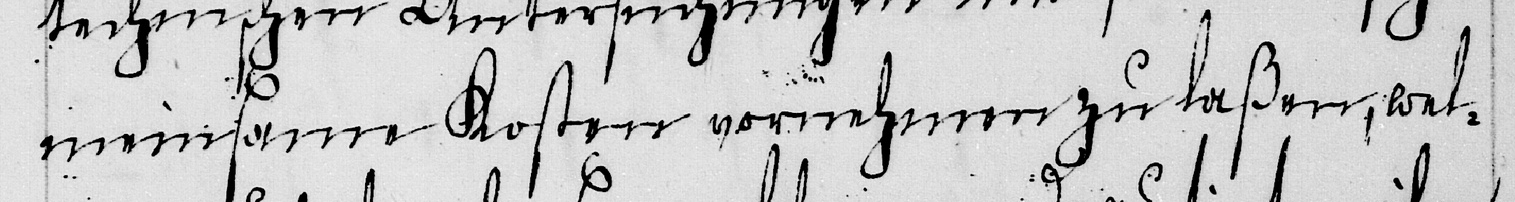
meinsame Kosten vornehmen zu laßen, wel¬
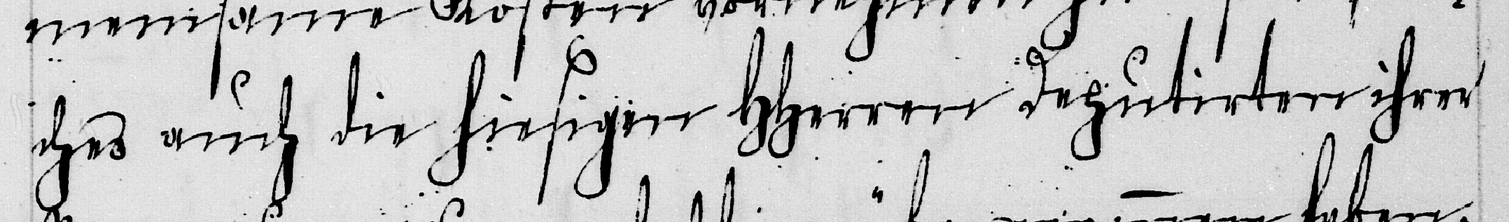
ches auch die hiesigen HHerren Deputirten ihrer
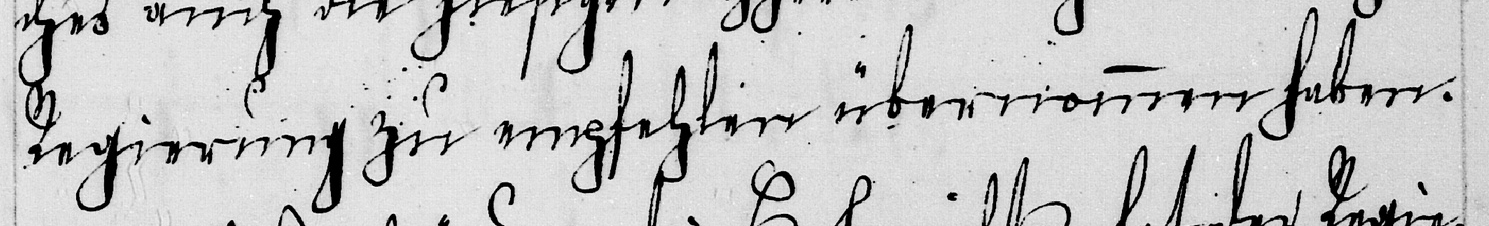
Regierung zu empfehlen übernommen haben.
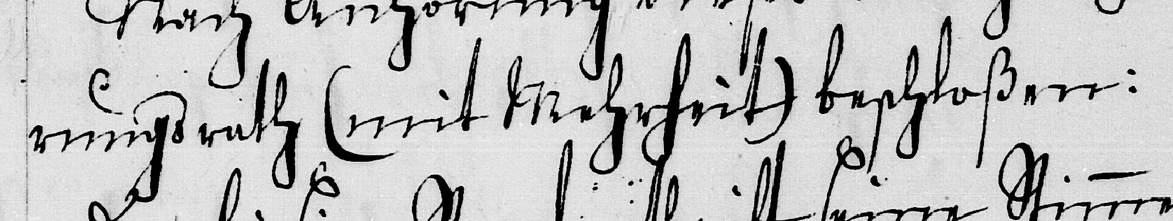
rungsrath (mit Mehrheit) beschloßen:
